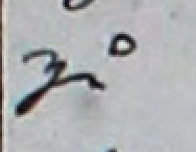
zu
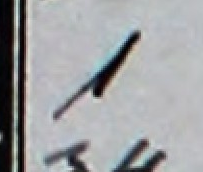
1
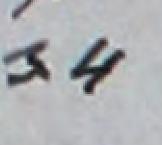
3, 4
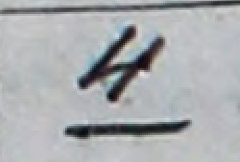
4
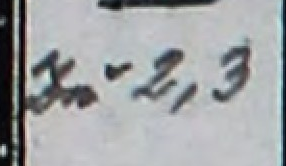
Zu 2, 3
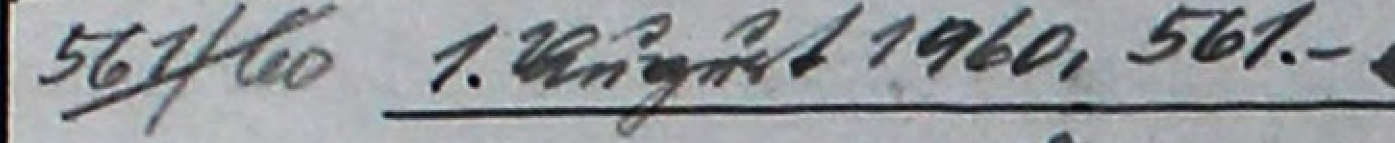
561/60 1. August 1960, 561.- ?
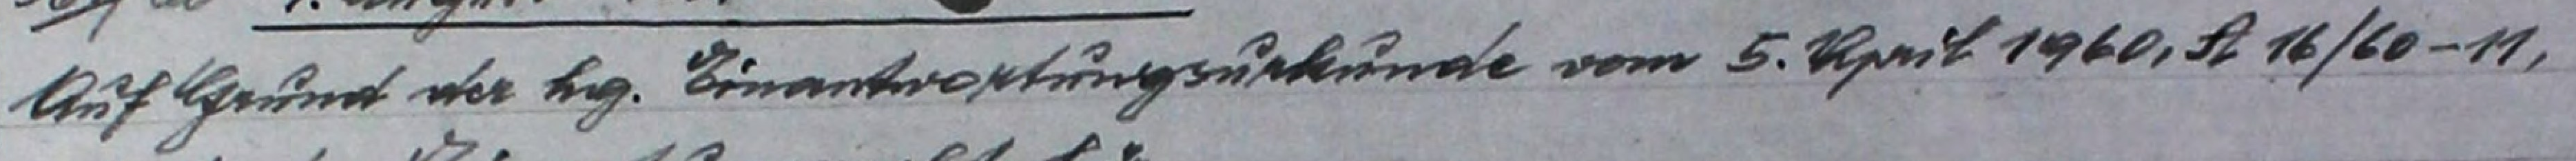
Auf Grund der hg. Einantwortungsurkunde vom 5. April 1960, A 16/60-11,
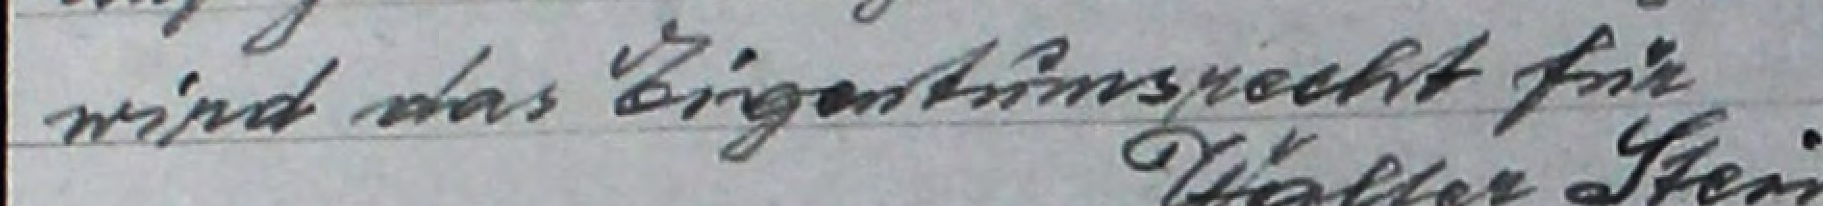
wird das Eigentumsrecht für
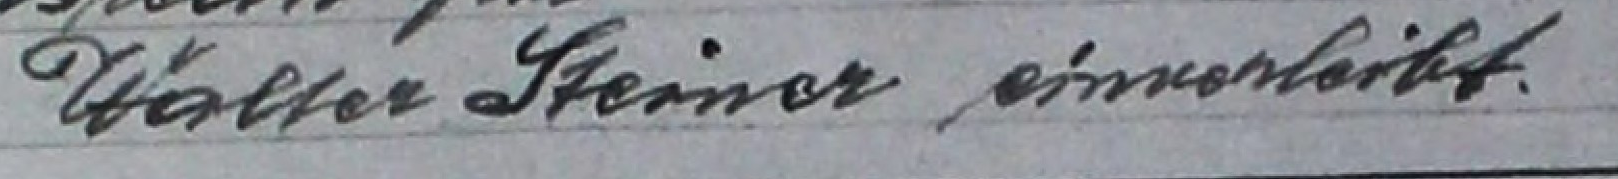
Walter Steiner einverleibt.
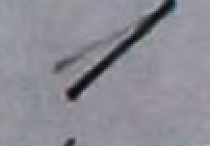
1
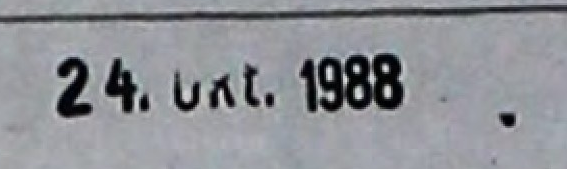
24. Okt. 1988
